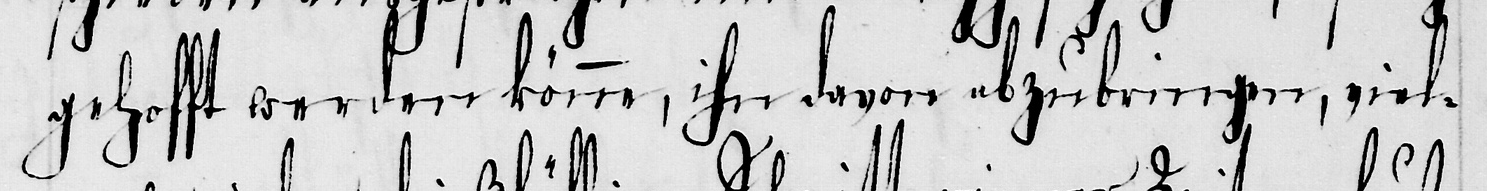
gehofft werden könne, ihn davon abzubringen, viel¬
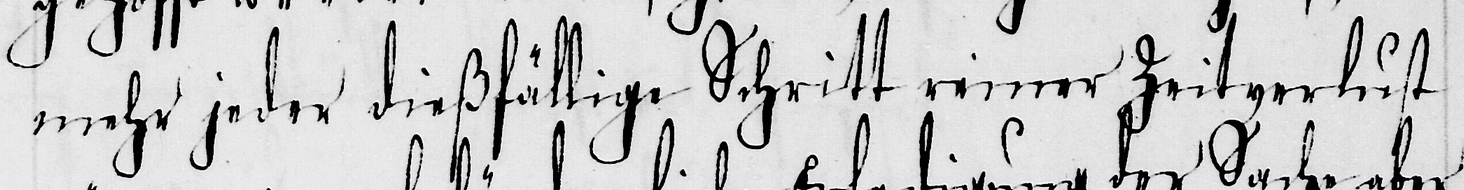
mehr jeder dießfällige Schritt reiner Zeitverlust
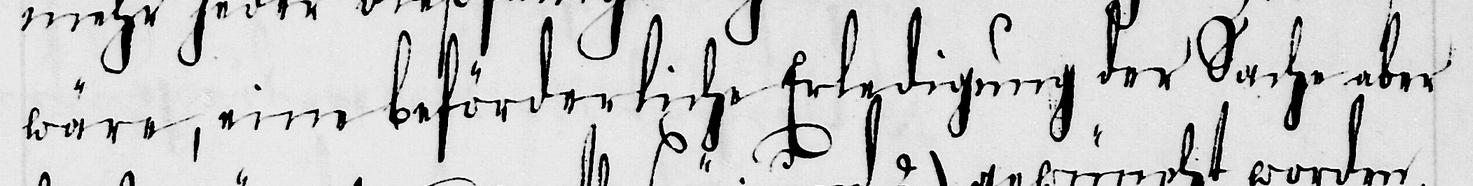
wäre, eine beförderliche Erledigung der Sache aber
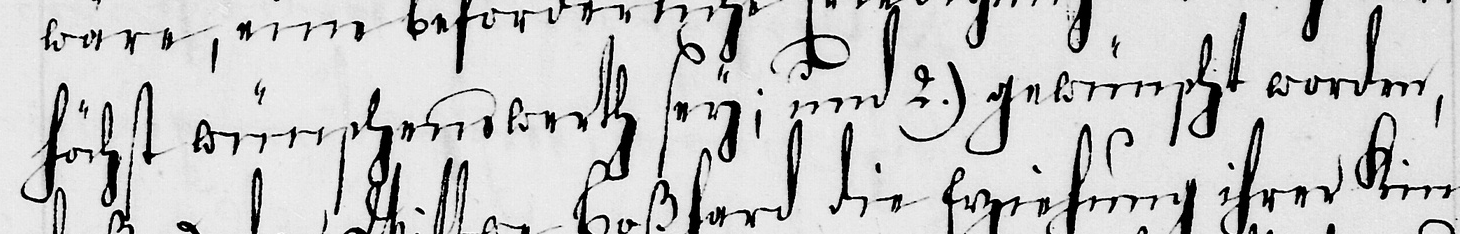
höchst wünschenswerth sey; und 2.) gewünscht worden,
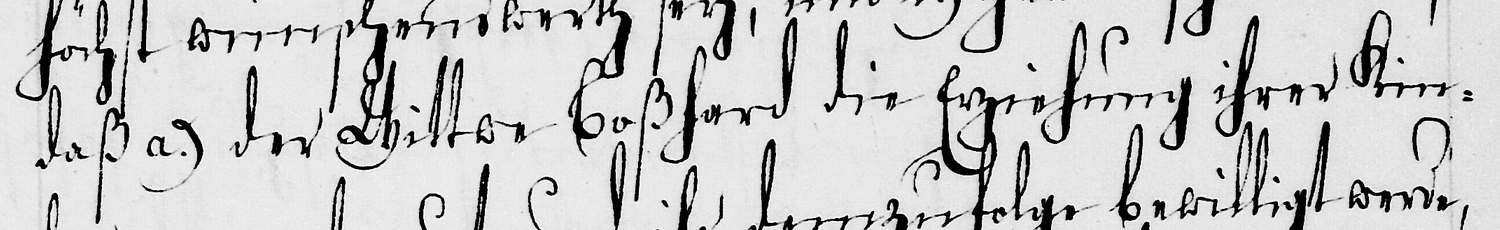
daß a.) der Wittwe Boßhard die Erziehung ihrer Kin¬
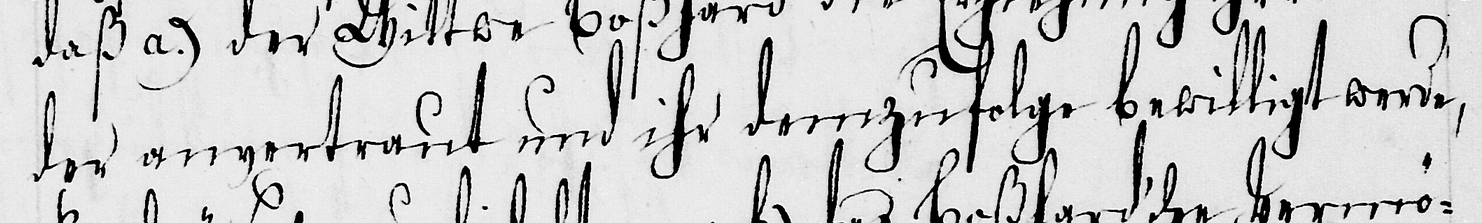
der anvertraut und ihr demzufolge bewilligt werd¬
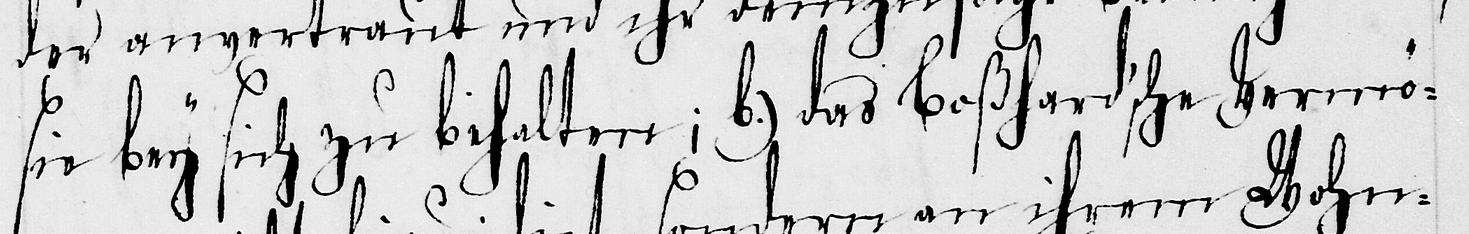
sie bey sich zu behalten; b.) das Boßhard’sche Vermö¬
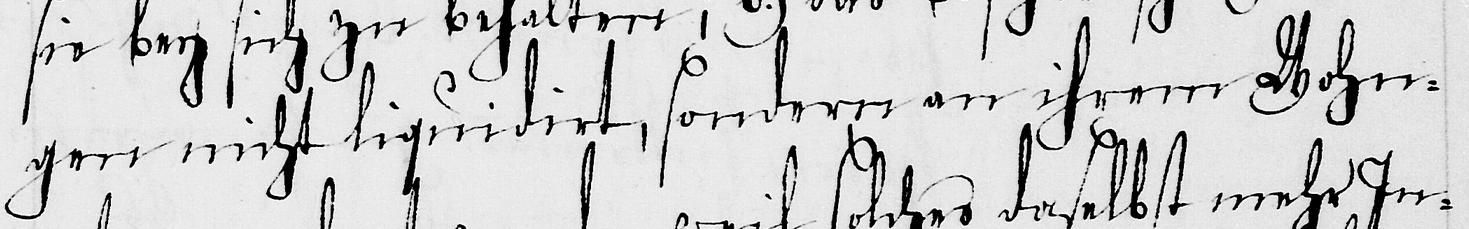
gen nicht liquidirt, sondern an ihrem Wohn¬
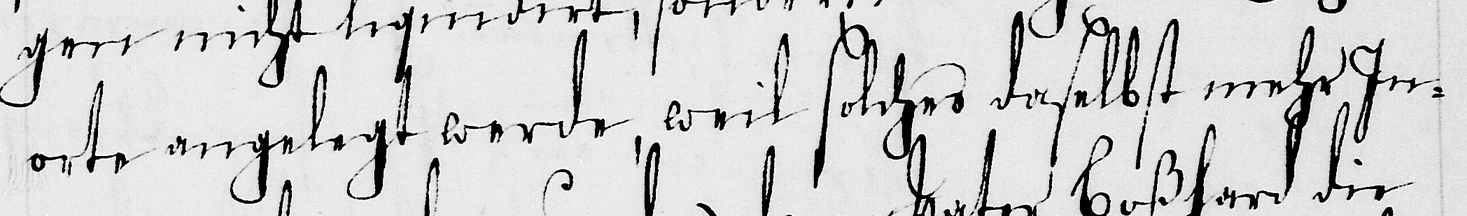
orte angelegt werde, weil solches daselbst mehr In¬
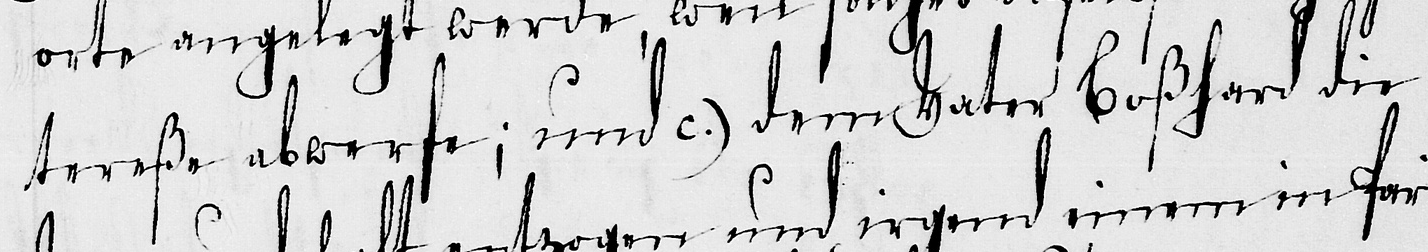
tereße abwerfe; und c.) dem Vater Boßhard die
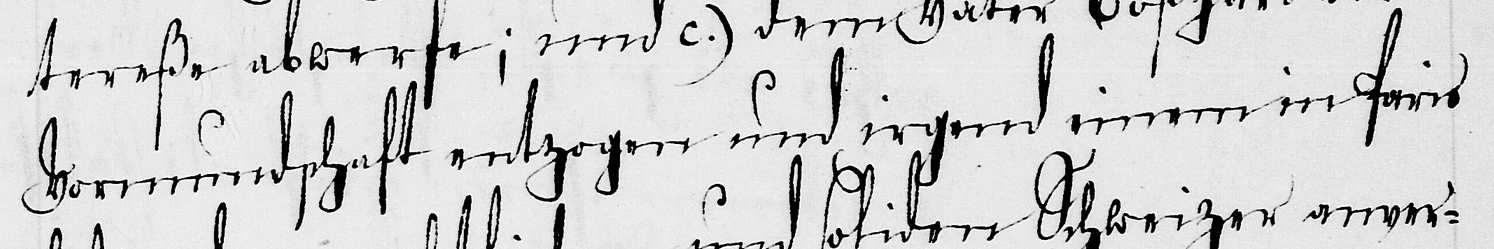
Vormundschaft entzogen und irgend einem in Paris
